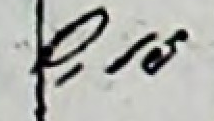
0,15
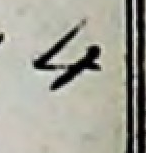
4
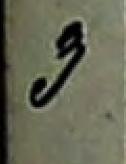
3
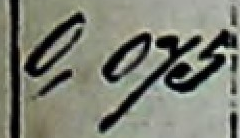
0,075
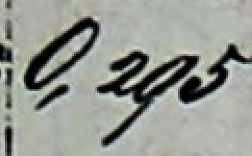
0,295
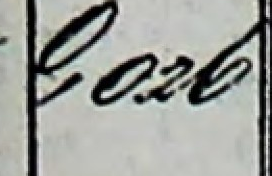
0,026
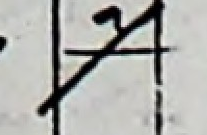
7
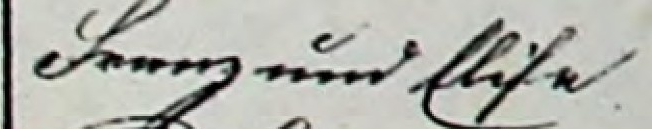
Franz und Elise
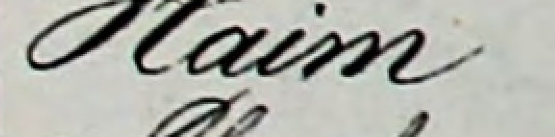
Haim
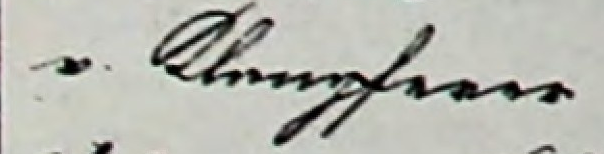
v. Klangferer
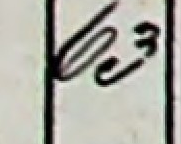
63
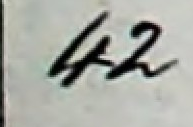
42
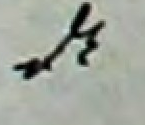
do
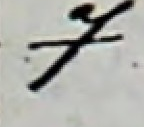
7
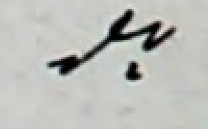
do
